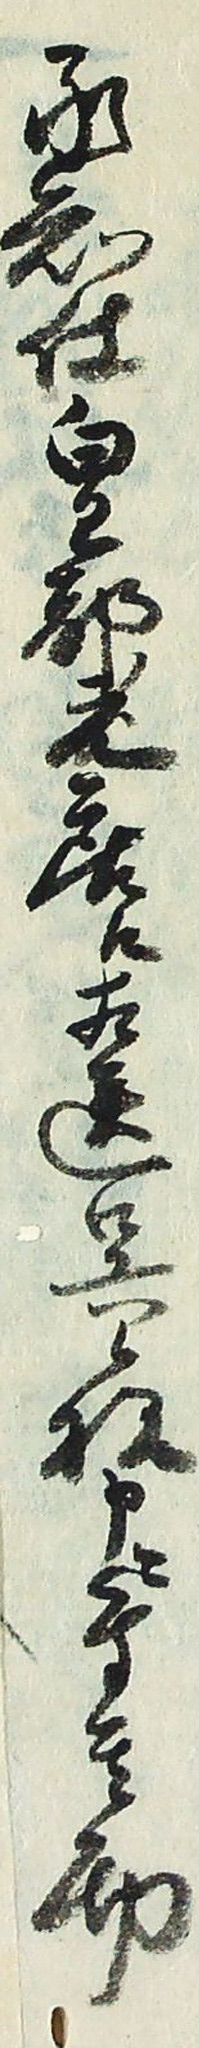承知仕皇都元座え相送呉候様申に付其砌
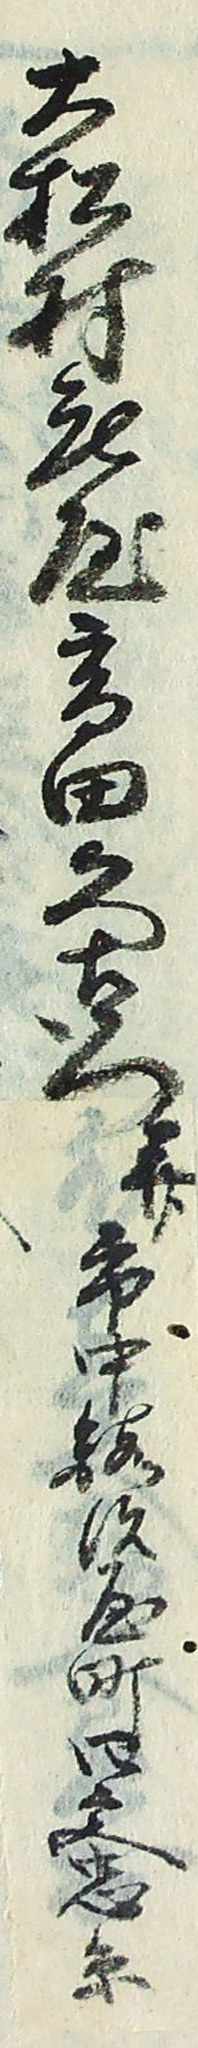大松村庄屋高田久左衛門幷市中鍛冶屋町四宮忠兵衛
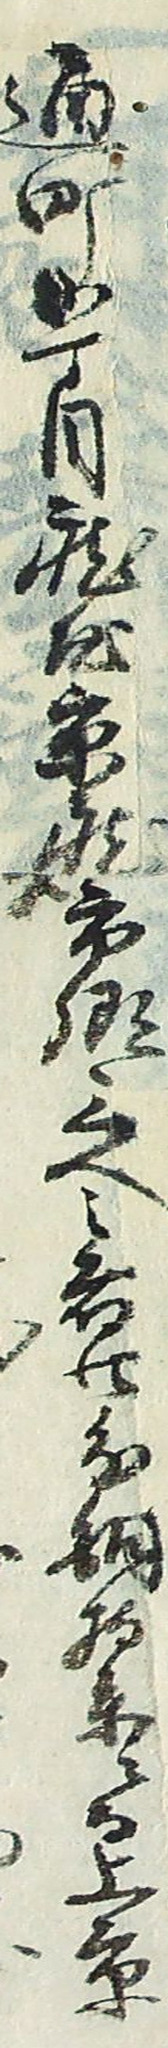通町二丁目蔵屋京蔵市蔵三人の者共分銅持参にて上京
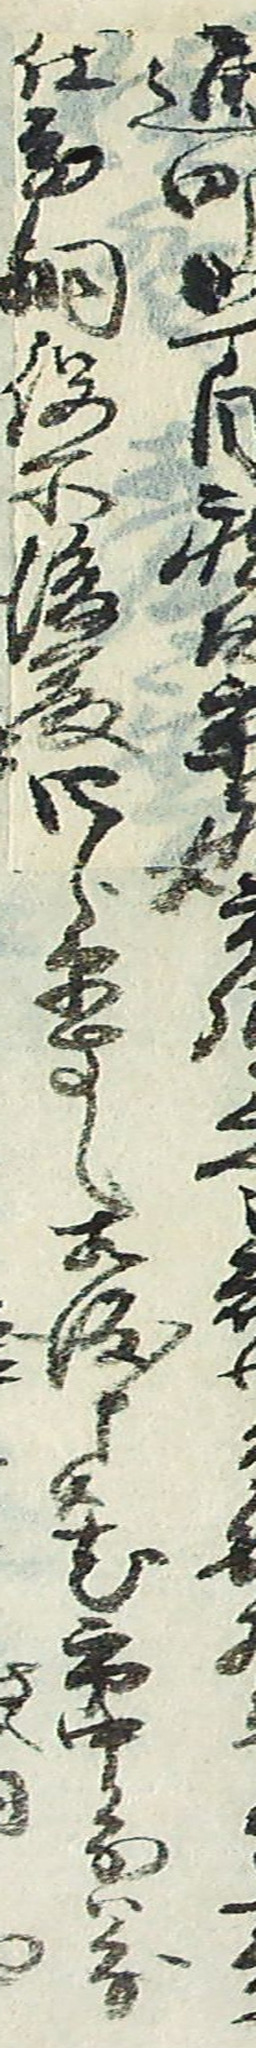仕分銅役所後藤四郎兵衛方へ相渡申候尤市中分は分
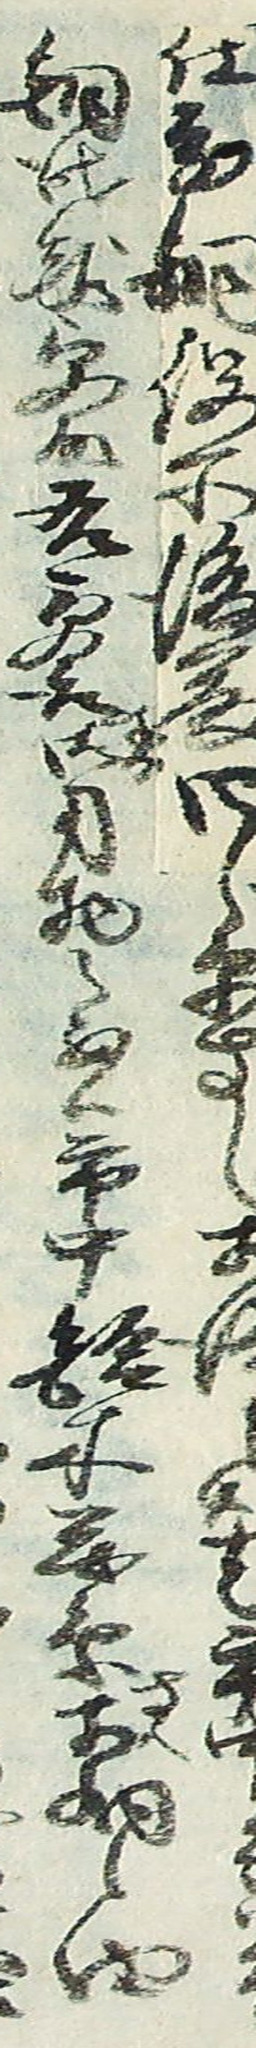銅代銀受取右受取御用物の義は市中鈴木茂兵衛方へ相納候由
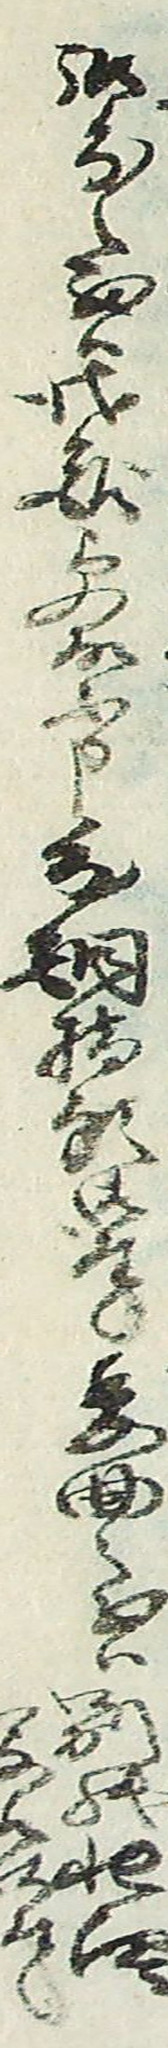残分の儀は代銀受取不申分銅指預御座候委曲の義は別紙帳面に

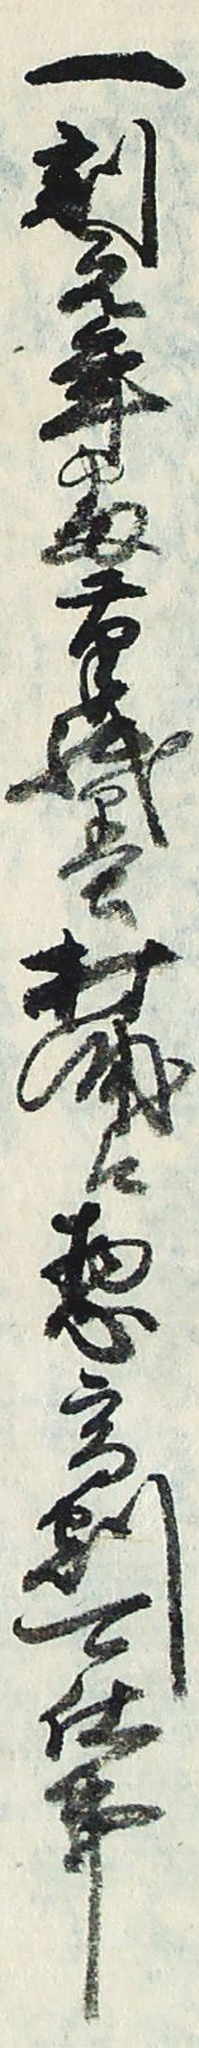一割元年番筆紙墨村浦え惣高割可仕事
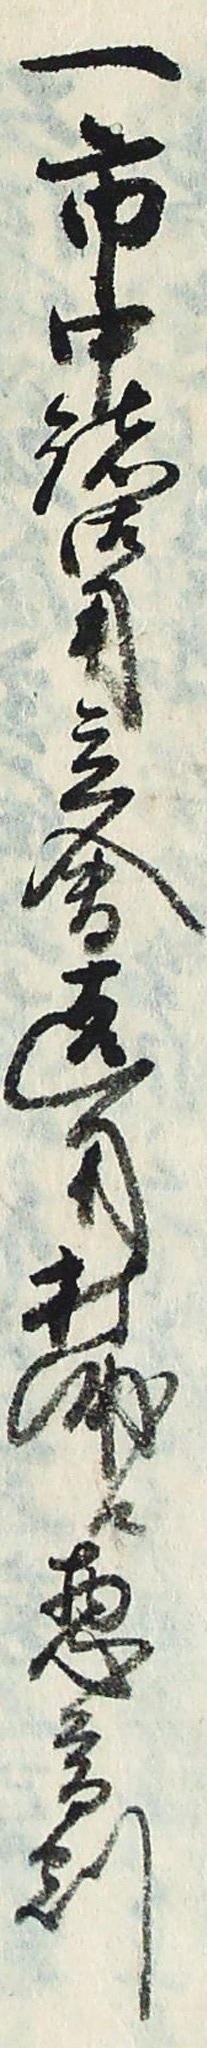一市中諸御用立会造用村浦え惣高割
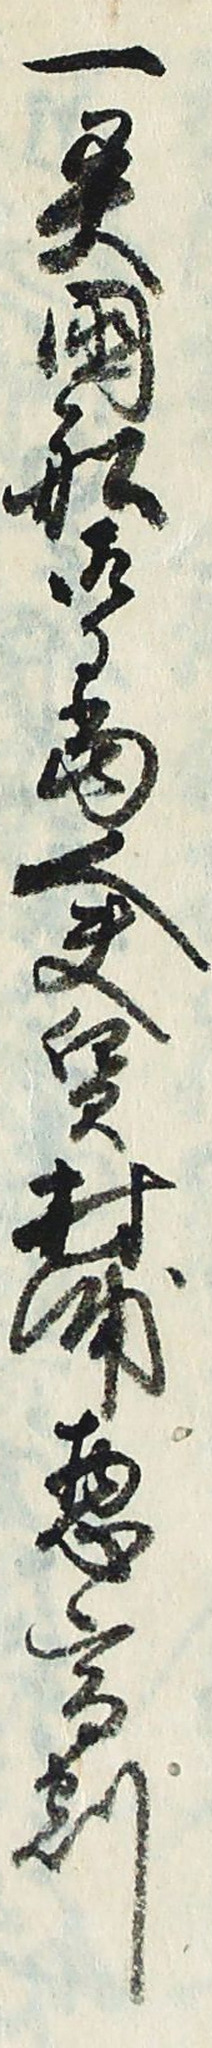一異国船御手当人夫賃村浦惣高割
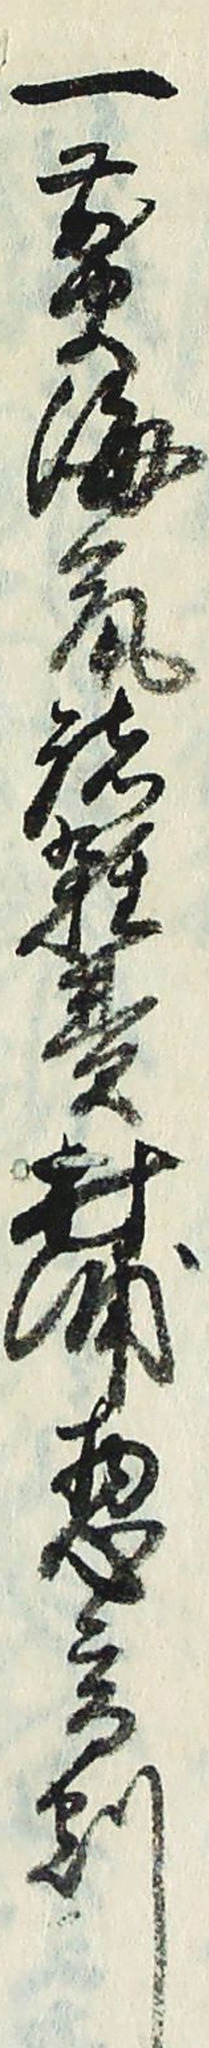一煎海鼠諸雑費村浦惣高割
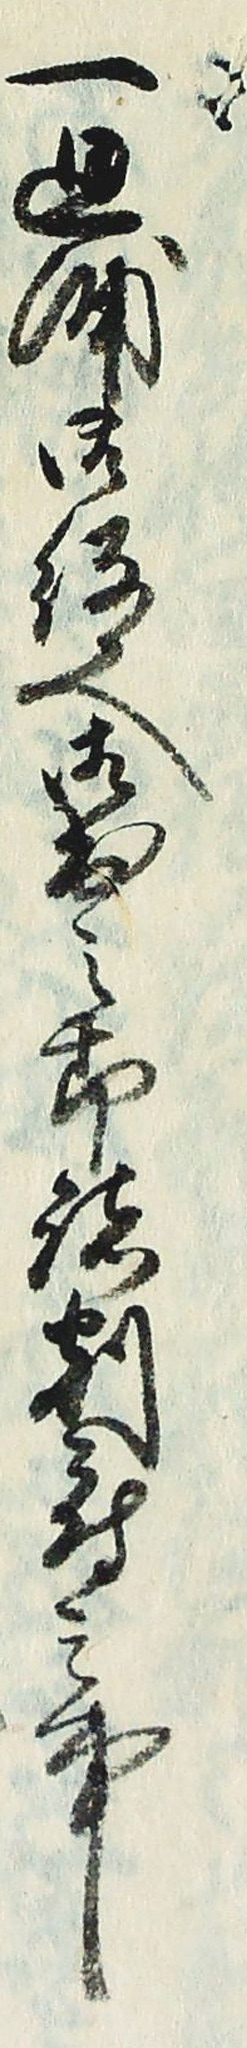一廻浦御役人御出の節諸割符の事
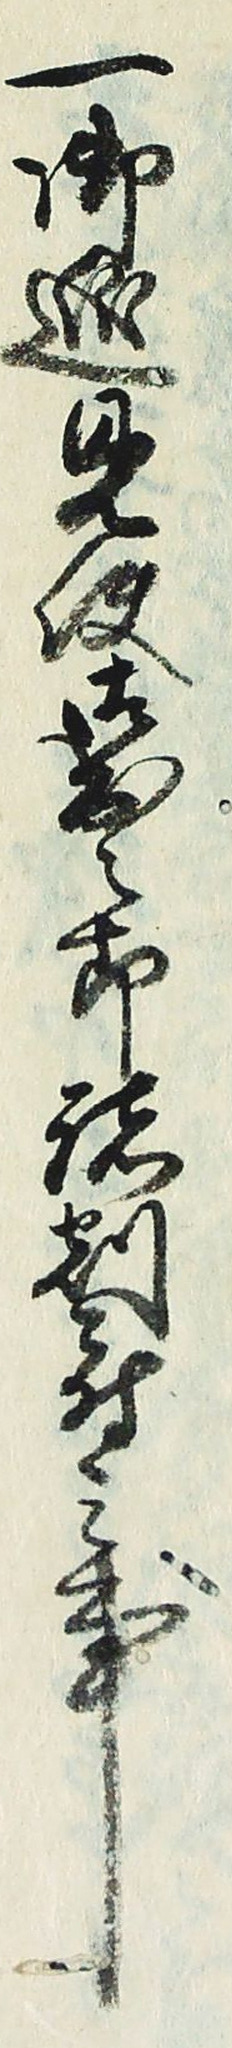一御巡見使御出の節諸割符の事
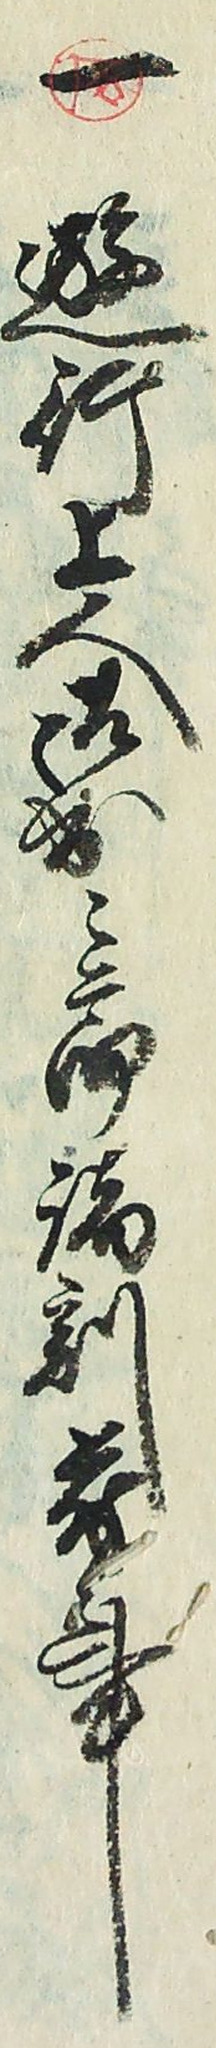一遊行上人御出の節諸割符の事
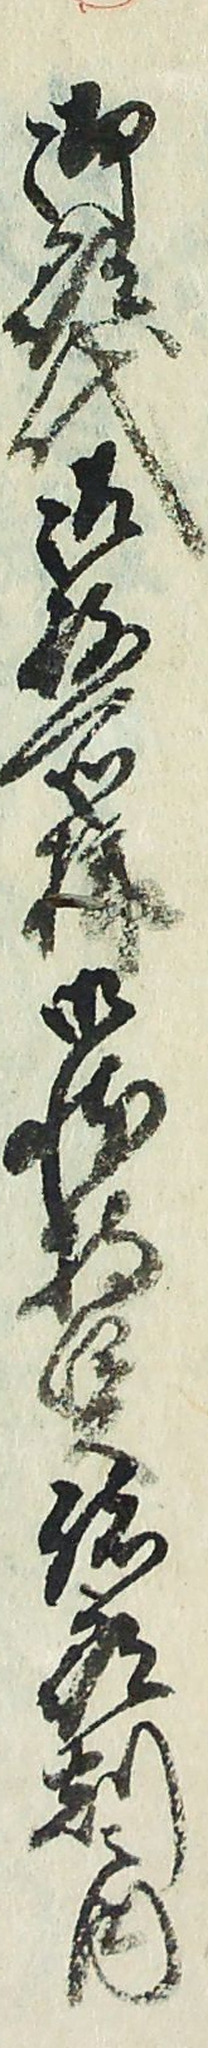一御郡代御役所様御状持賃諸郡割之内
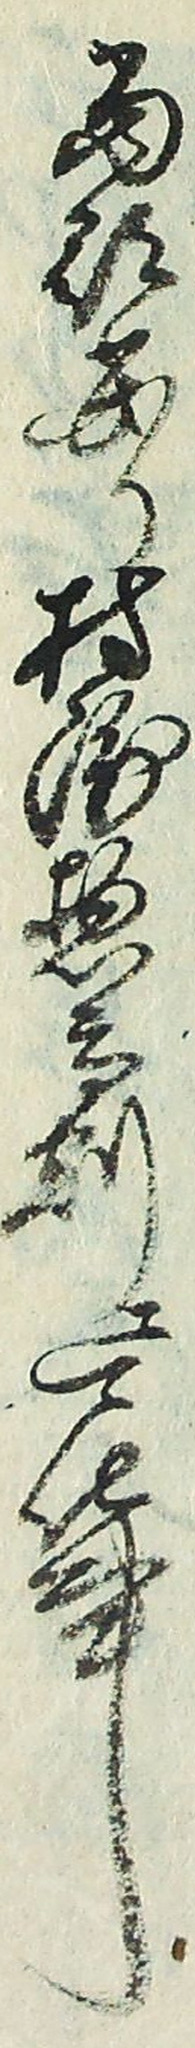当郡当り村浦惣高割に可仕事
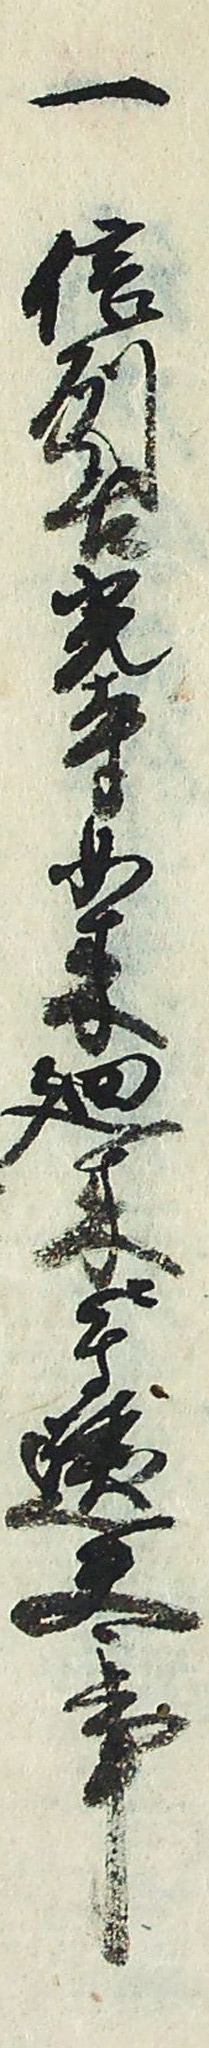一信州善光寺如来廻来に付逓夫の事
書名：諸割賦物賃銀定記録帳
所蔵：鳴門教育大学 Naruto University of Education
